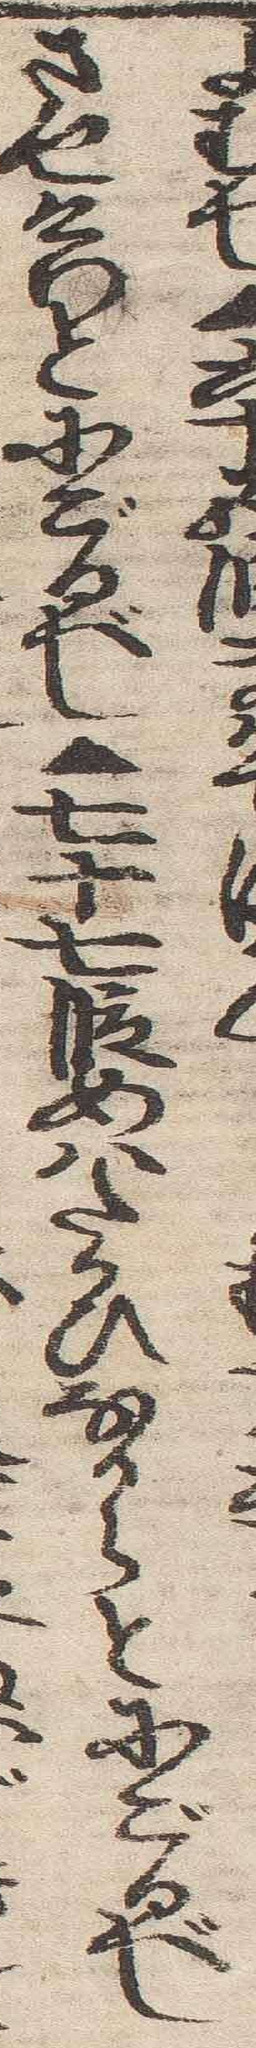させけりとにごるべし▲七十七段めはたかいなからとにごるべし
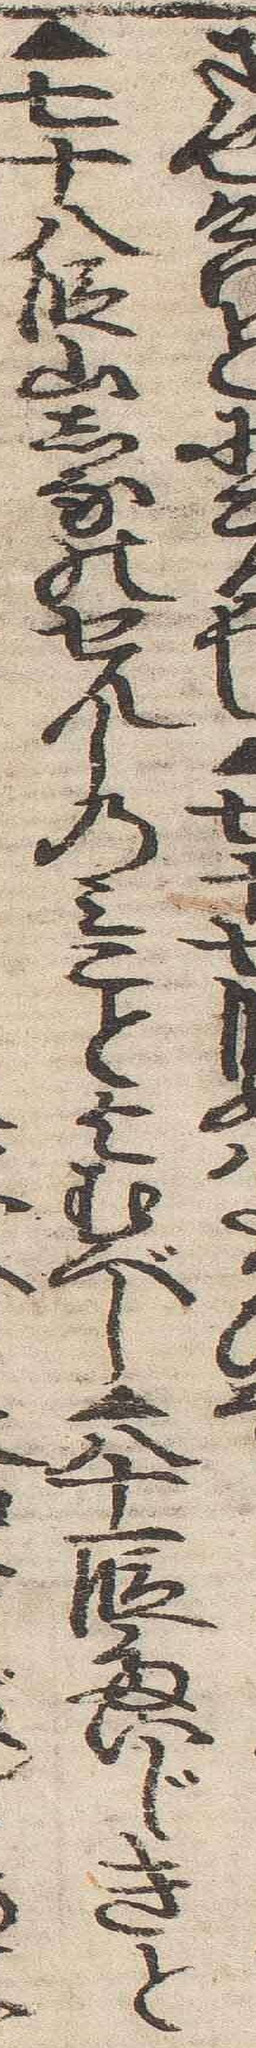▲七十八段山しなのせんしのみことよむべし▲八十一段たいじきと
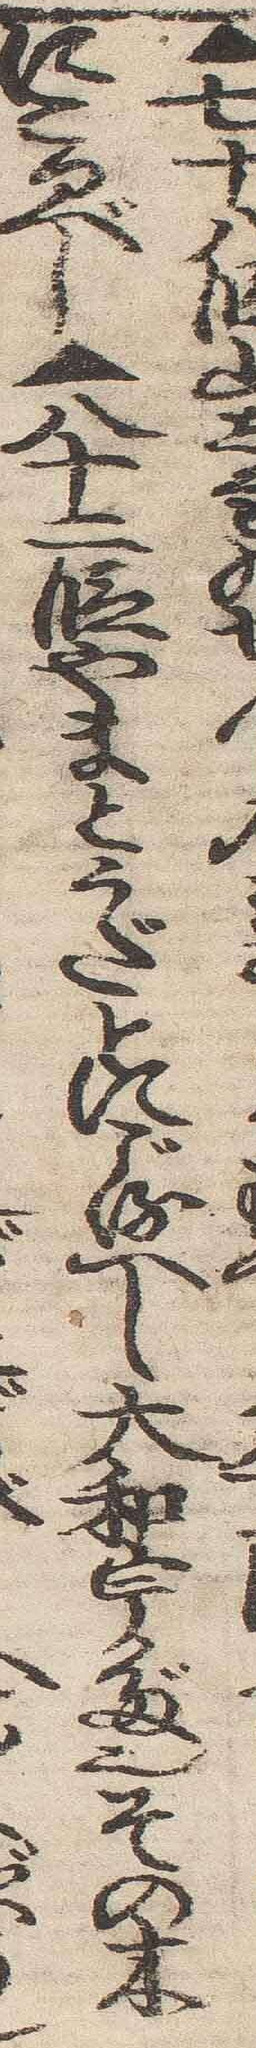にこるべし▲八十二段やまとうだとにごるへし大和宇だ也その木
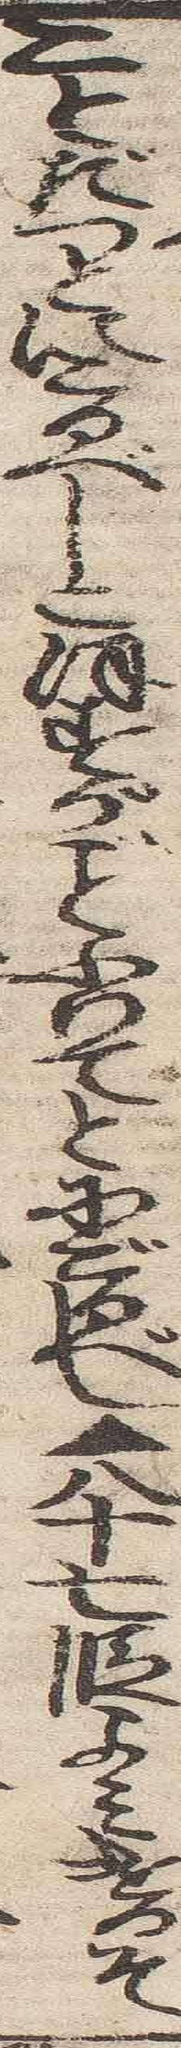ことだつとにこるべしこほすがごとふりてとにごるべし▲八十七段よみけるそ
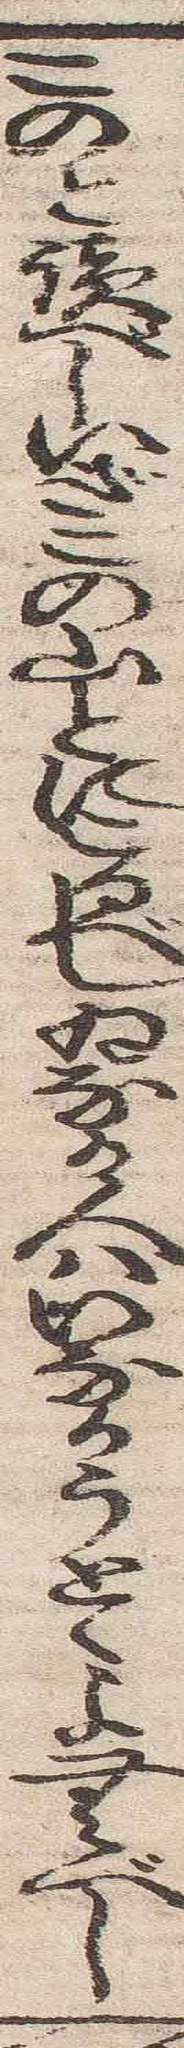このと読べしいざこの山とにこるべしゐなか人はいなかうとゝよむべし
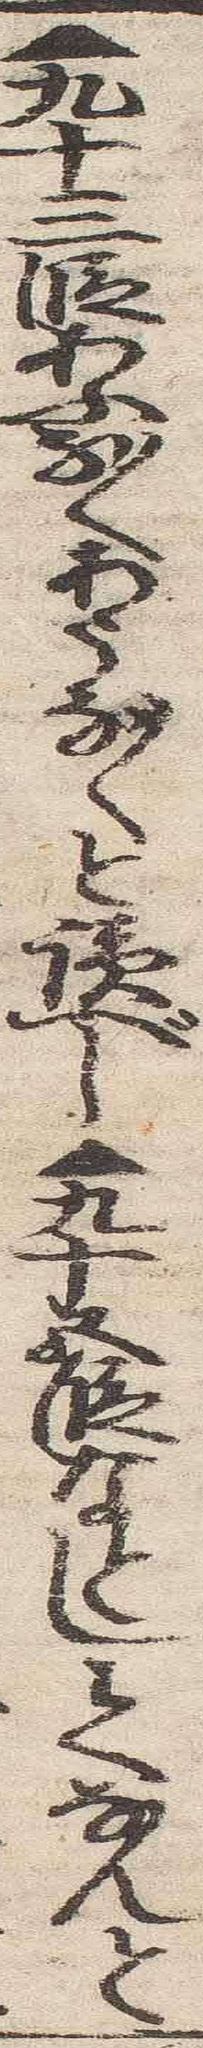▲九十三段あふな〳〵あうな〳〵と読べし▲九十五段なとしてなんと
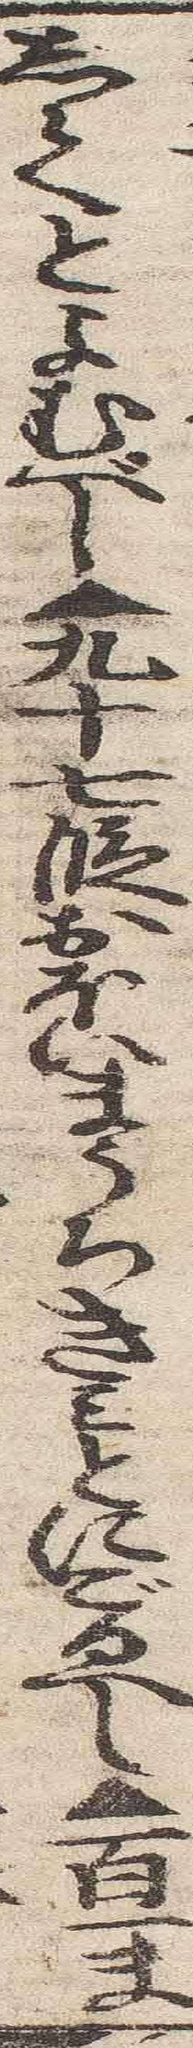してとよむべし▲九十七段おほいまうちきみとにごるへし▲百一[
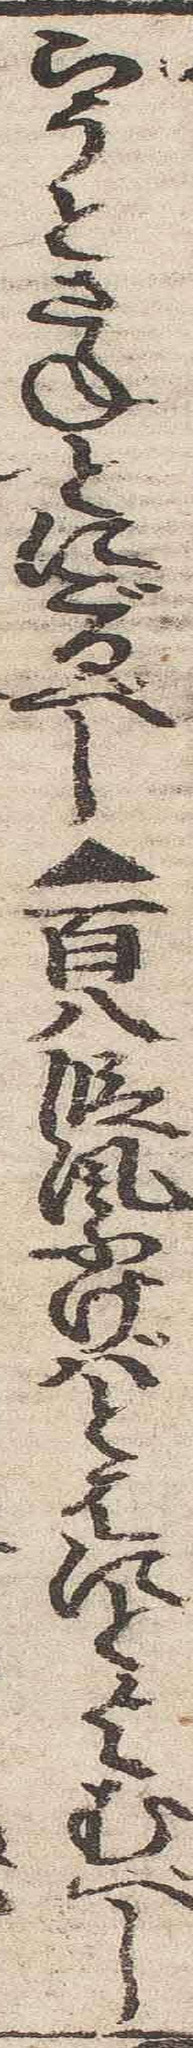らうとさねとにごるべし▲百八段風ふけばとはにとよむべし
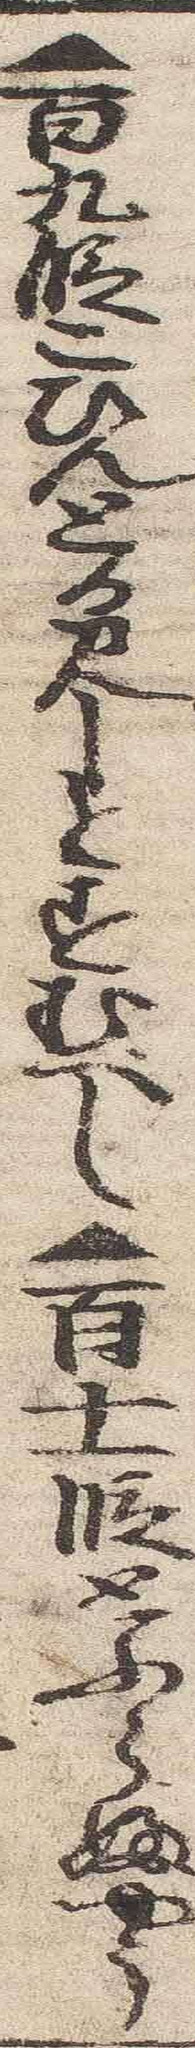▲百九段こひんとか見しとすむべし▲百十一段とふらふやう
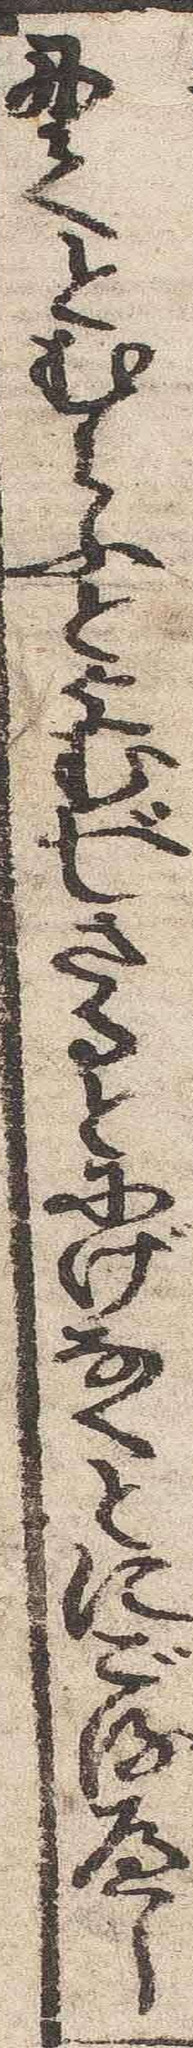にてとむらふとよむべしさるとにげなくとにごるへし
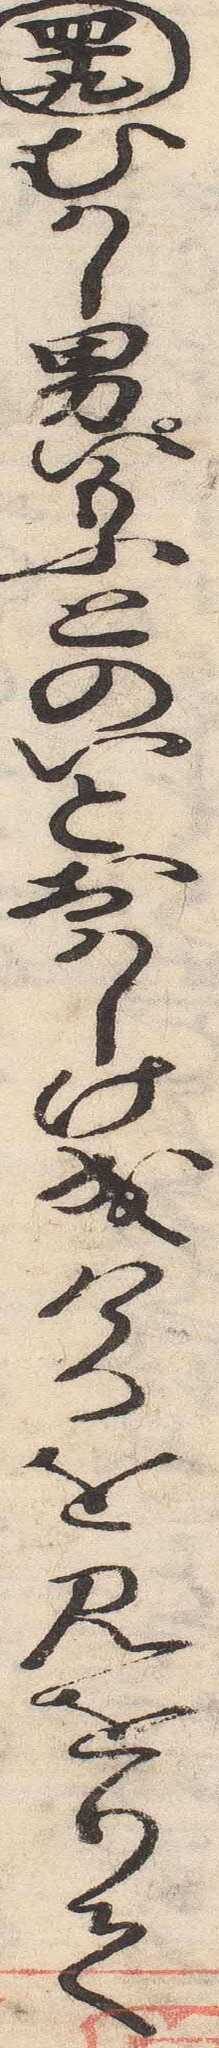四十九むかし男。いもふとのいとおかしけ成けるを見をりて
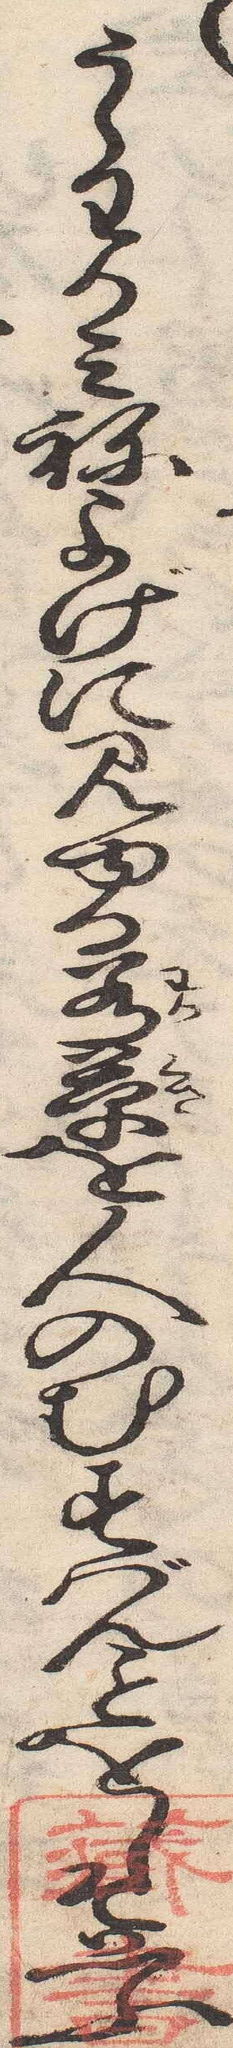うらわかみねよげに見ゆる若草を人のむすばんことをしそ思ふ
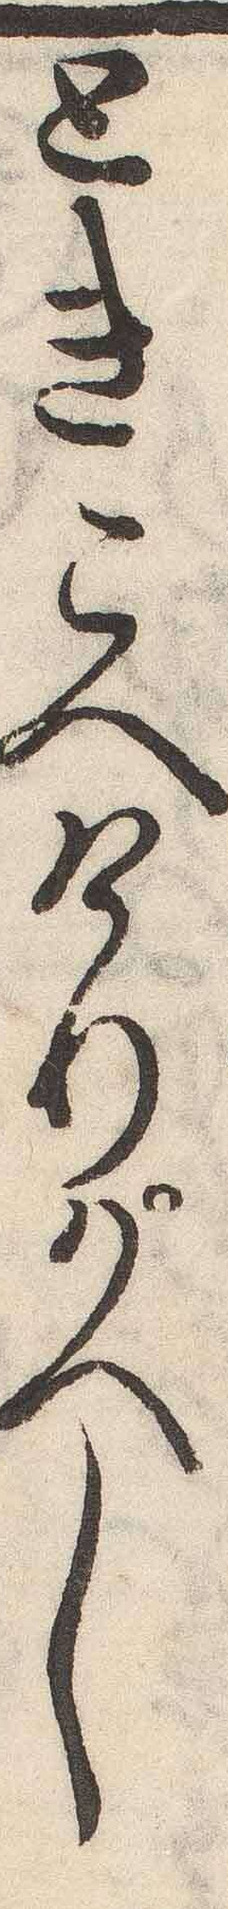ときこへけり。かへし
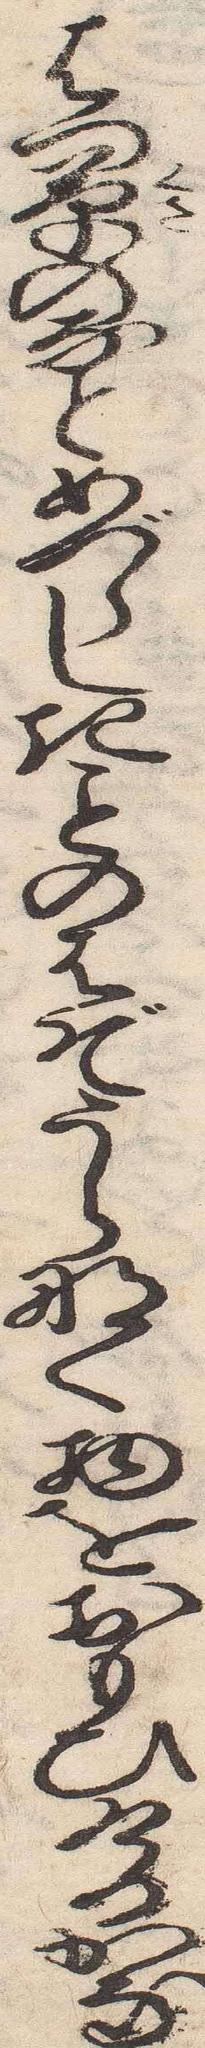はつ草のなとめづらしきことのはぞうらなく物をおもひけるかな
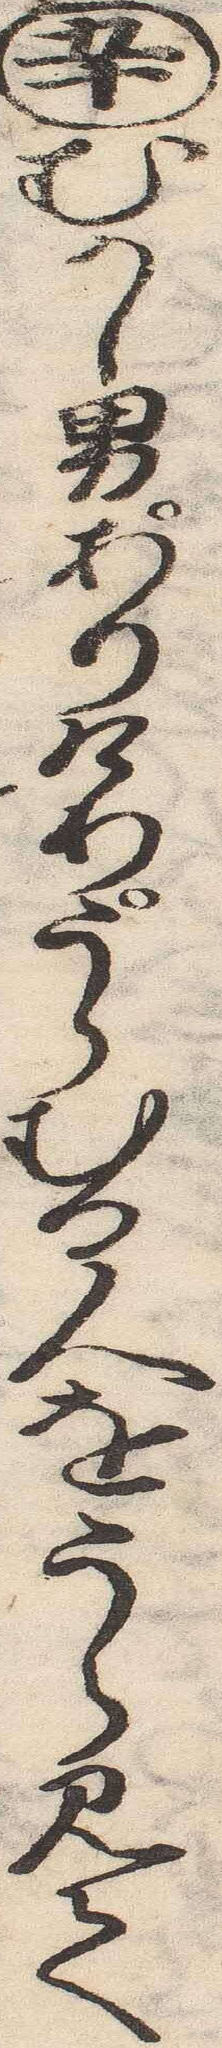五十むかし男。ありけり。うらむる人をうらみて
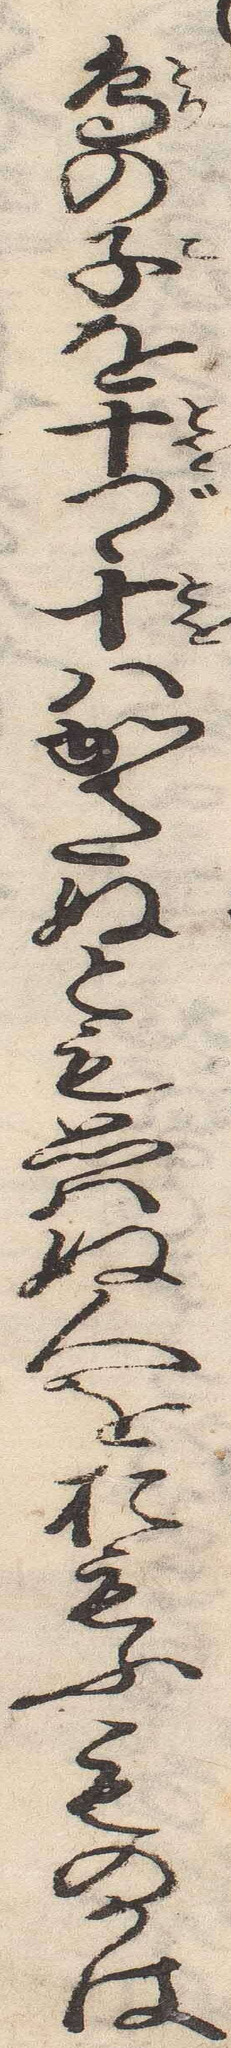鳥の子を十づつ十はかさぬとも思はぬ人をおもふものかは
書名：伊勢物語
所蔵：東京学芸大学附属図書館 国文学研究資料館
